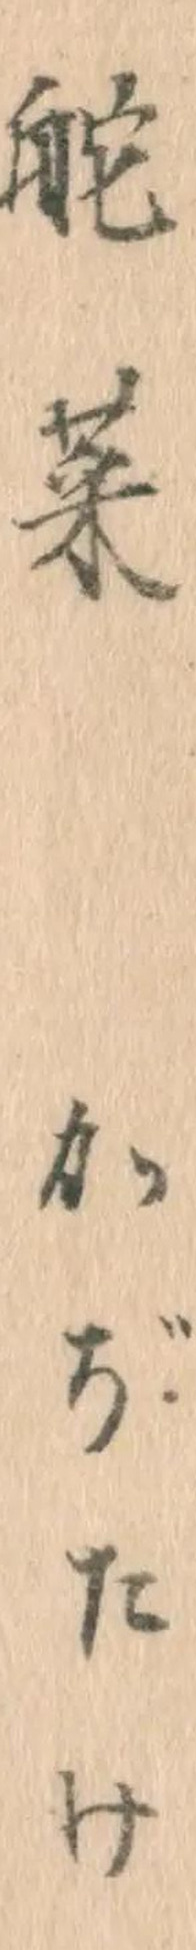舵菜かぢたけ
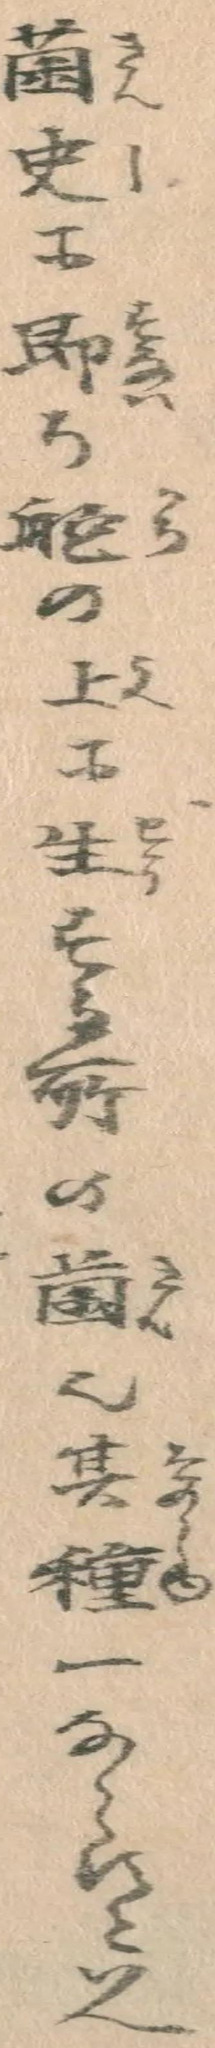菌史に即ち舵の上に生する所の菌也其種一ならすといへ
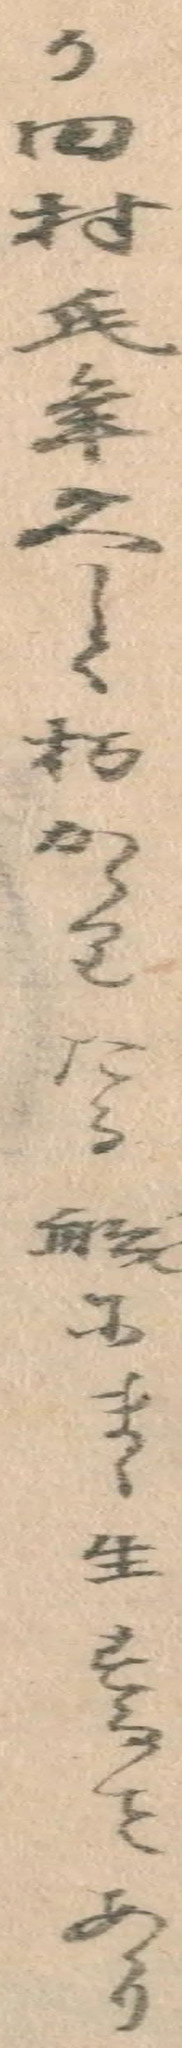り田村氏年久しく朽かゝりたる船にまゝ生することあり
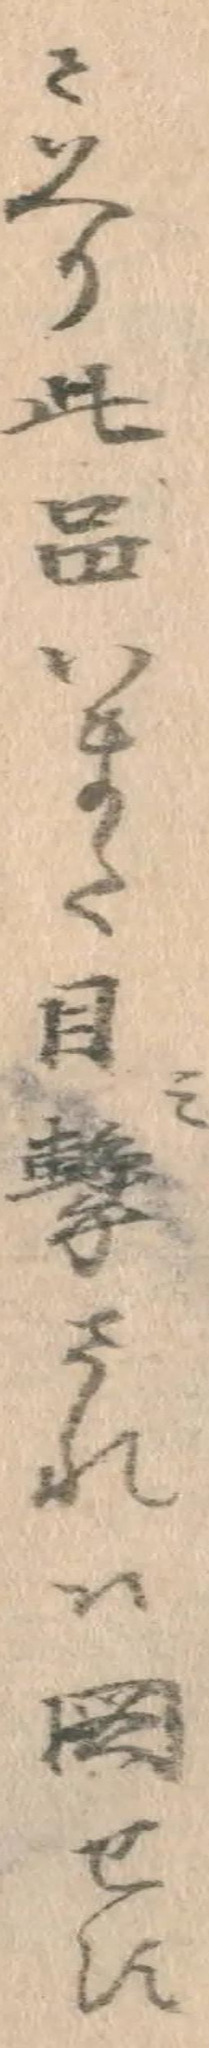といへり此品いまた目撃されは図せす
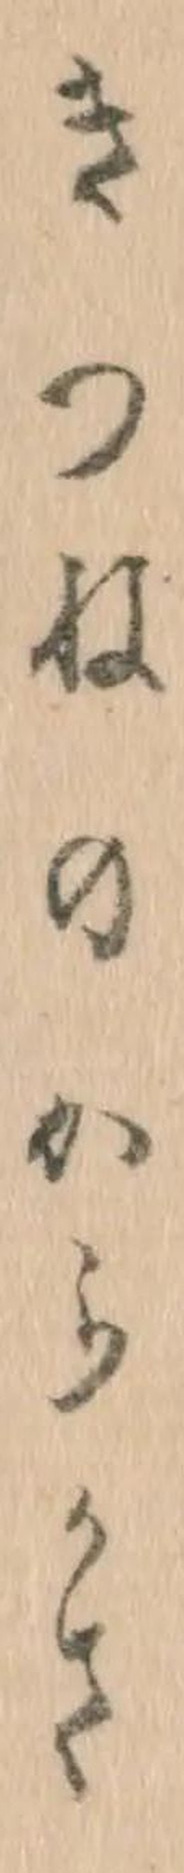きつねのからかさ
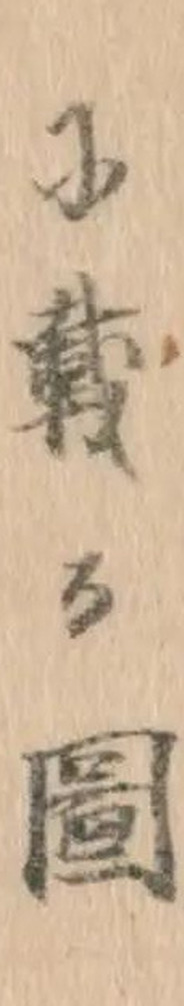に載る図

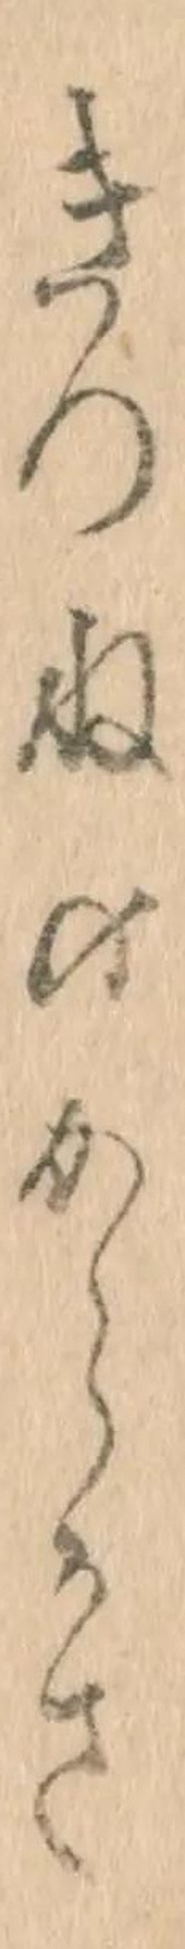きつねのからかさ
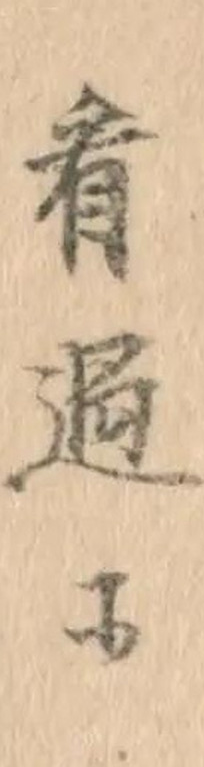看過に
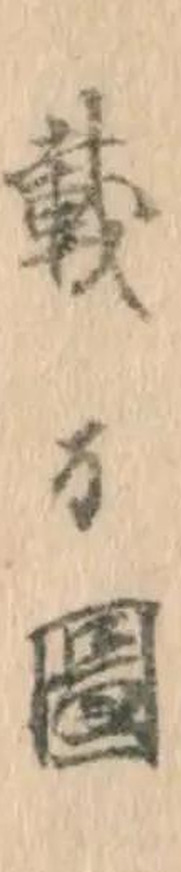載る図
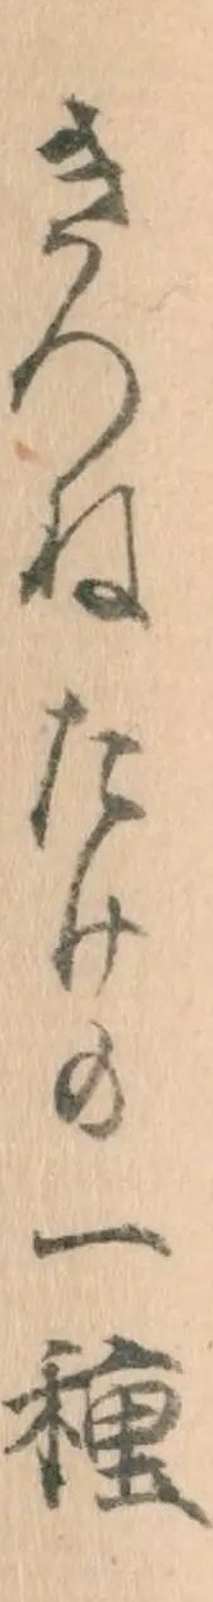きつねたけの一種
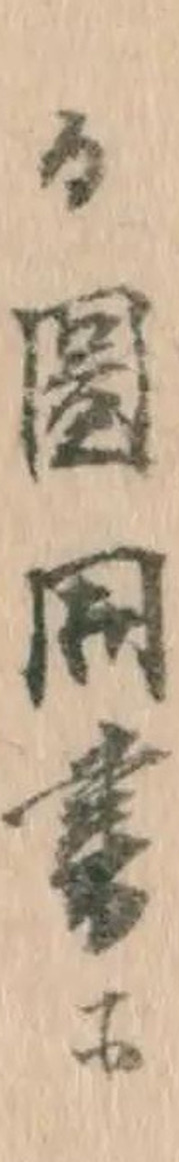る図同書に
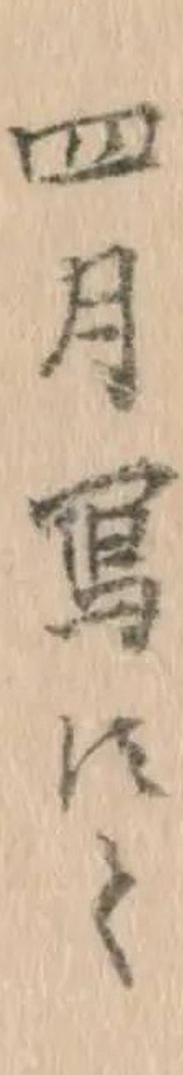四月写すと
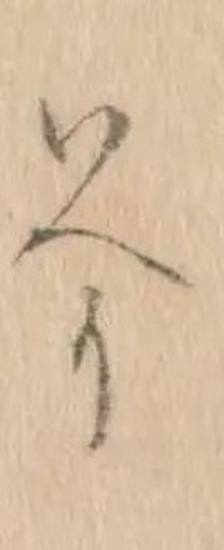いへり

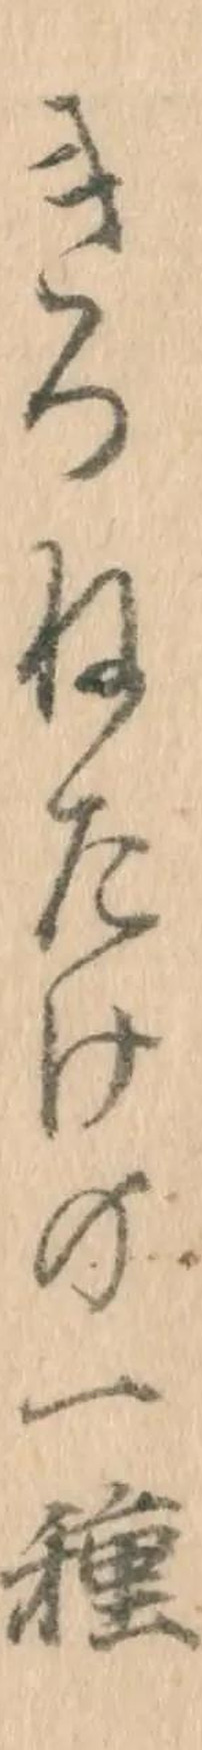きつねたけの一種
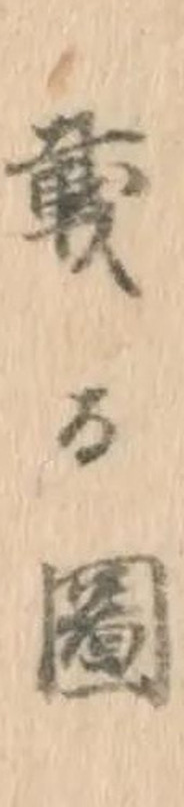載る図
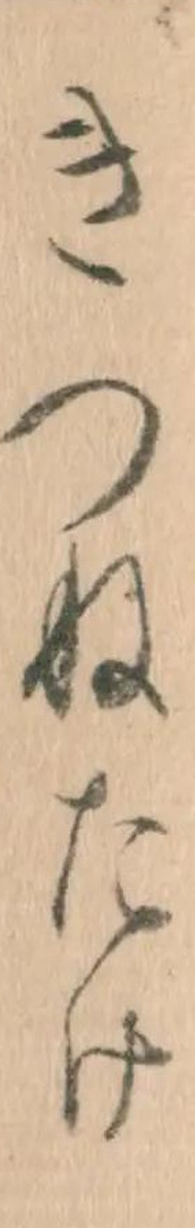きつねたけ
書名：本草図譜. 巻58-60
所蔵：国立国会図書館 National Diet Library, JAPAN
